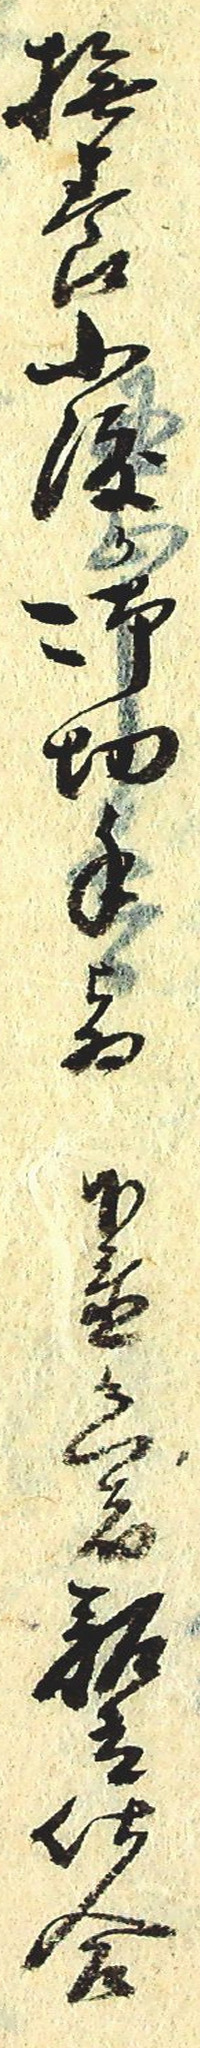撫養小渡御切手被為下置候へは難有仕合
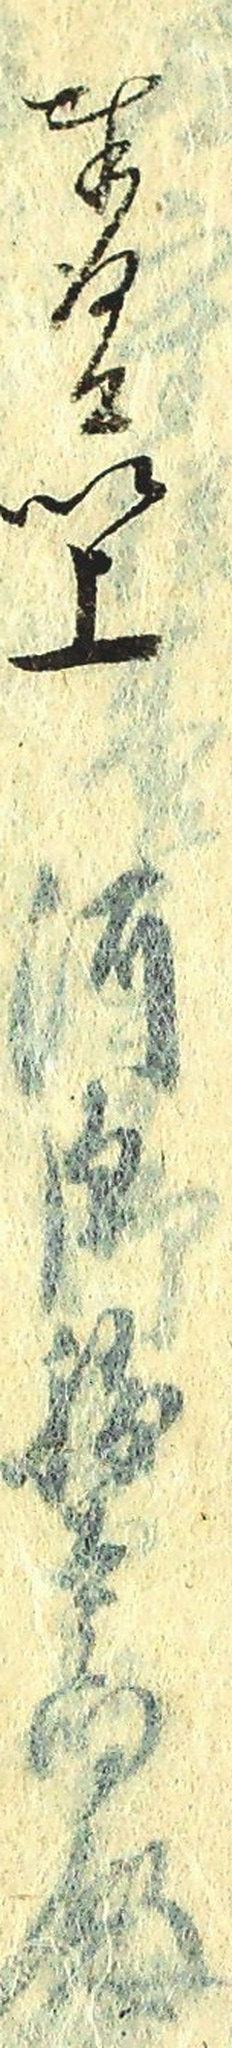奉存候以上
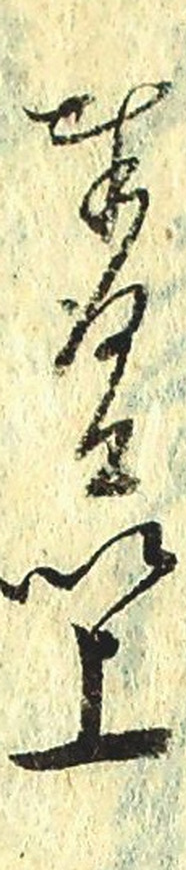奉存候以上
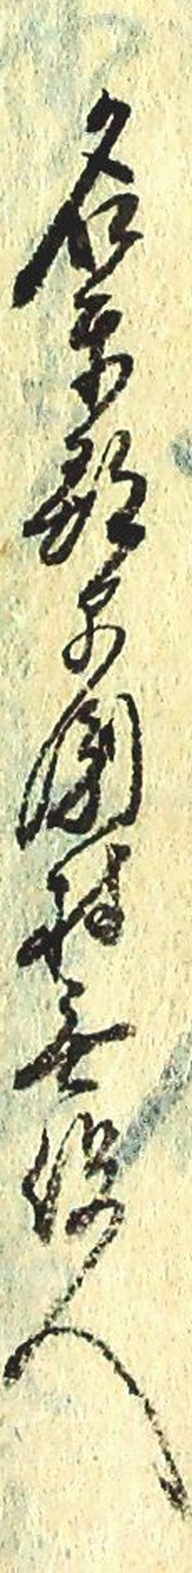名東郡早淵村無役人
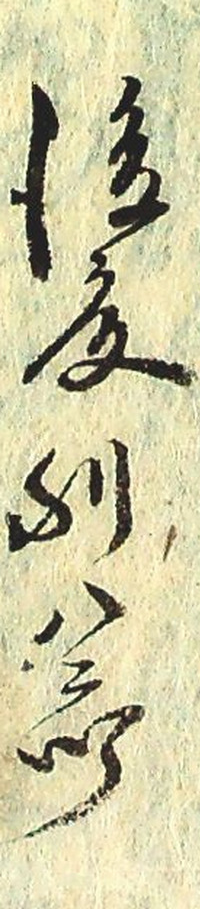後藤利八郎
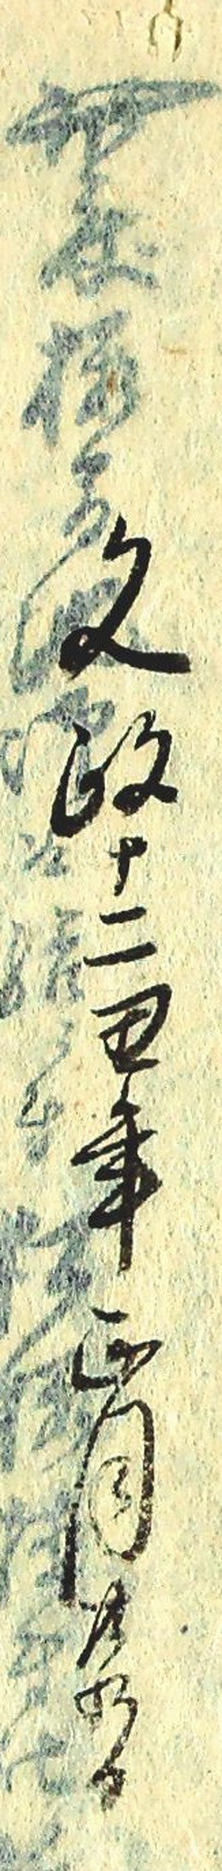文政十二丑年正月廿九日
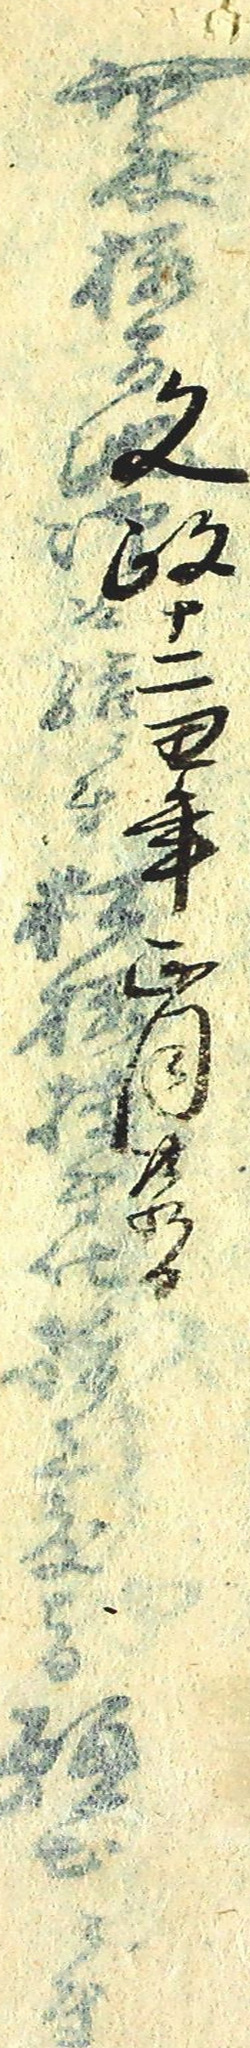文政十二丑年正月廿九日
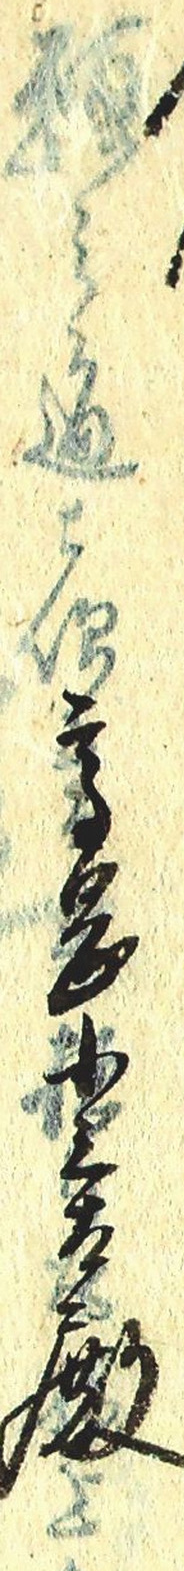高岡小三太殿
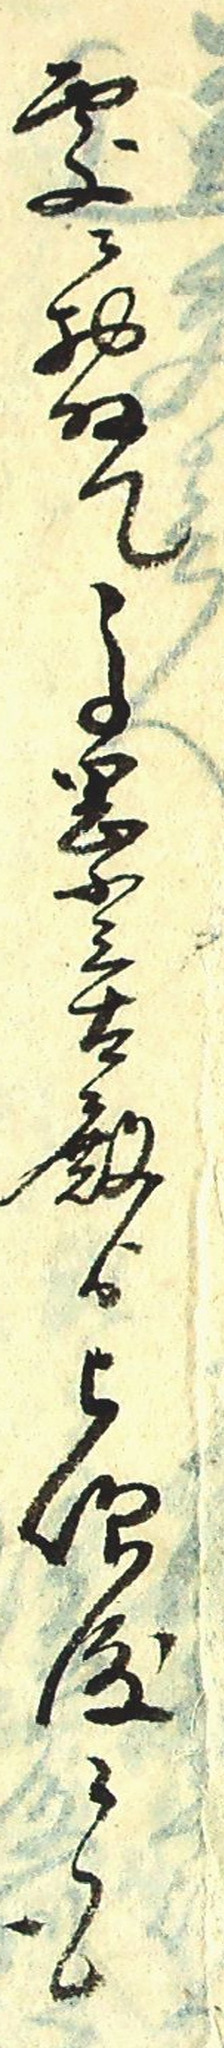処におゐて高岡小三太殿ゟ被仰渡候以上
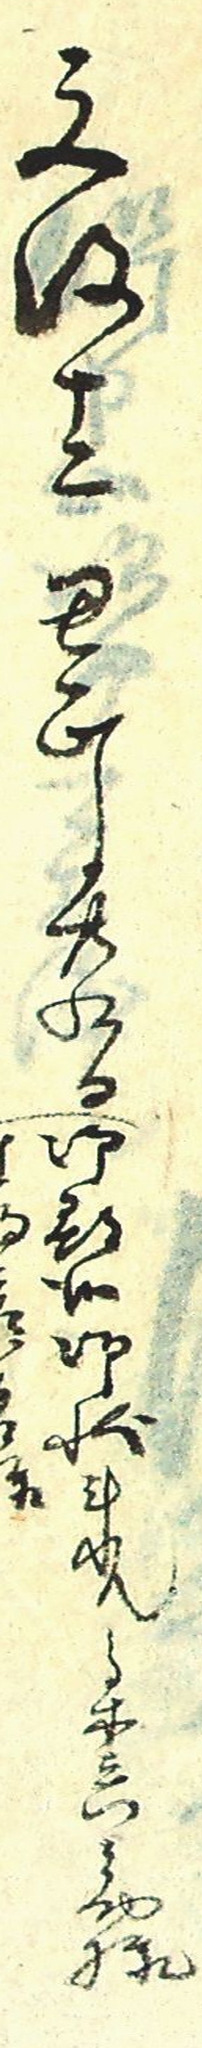文政十二丑正月廿九日御郡代御状来る高木真之助様

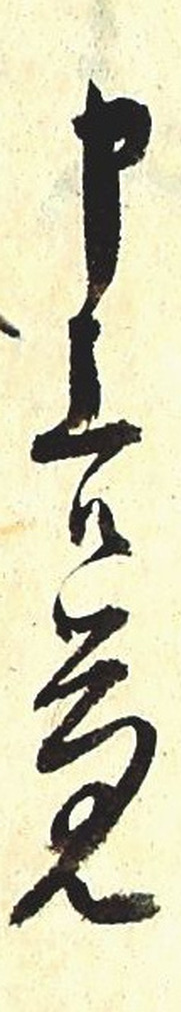申上る覚
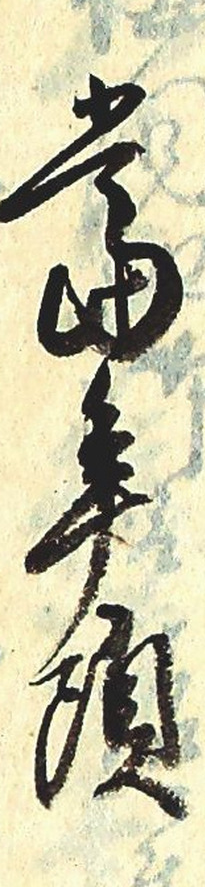当年頭
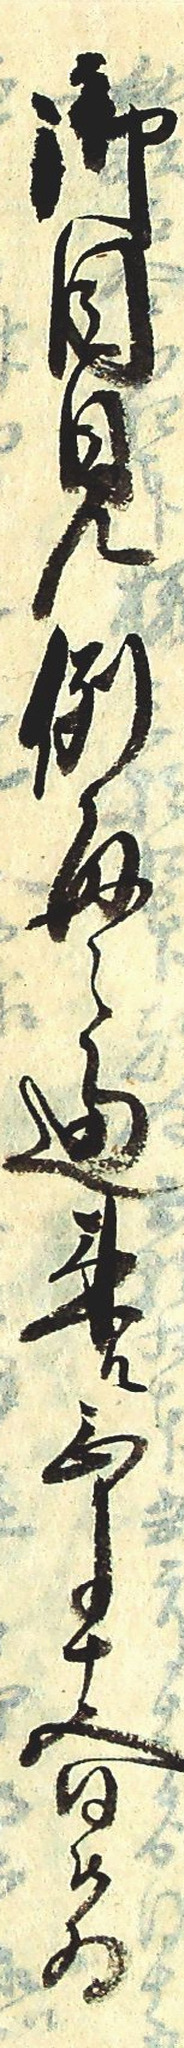御目見例毎之通来る正月十五日被為
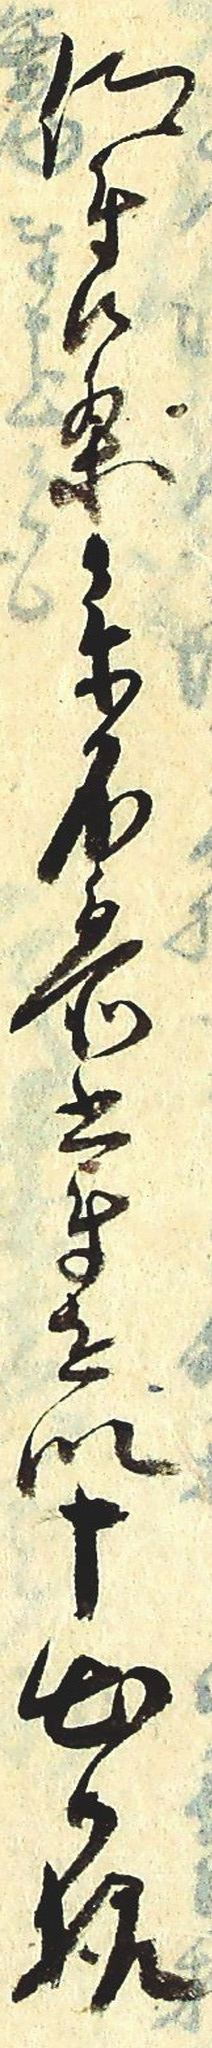仰付候条参不参書付を以申出候様
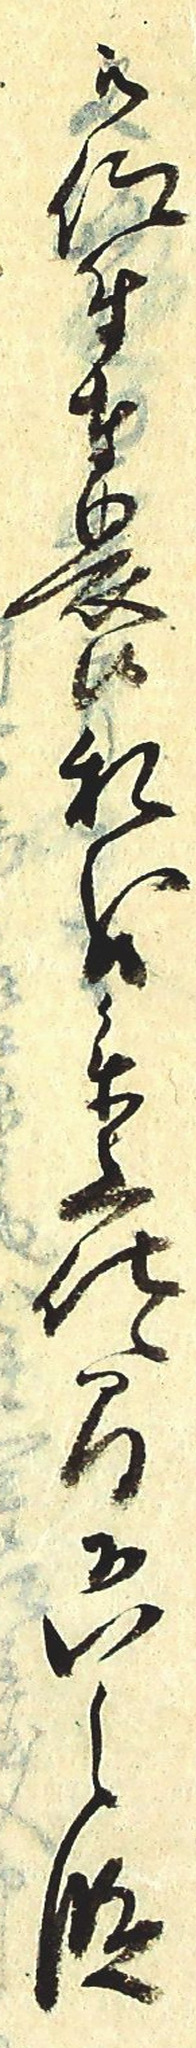被仰付奉畏候私義参上仕候間右之段
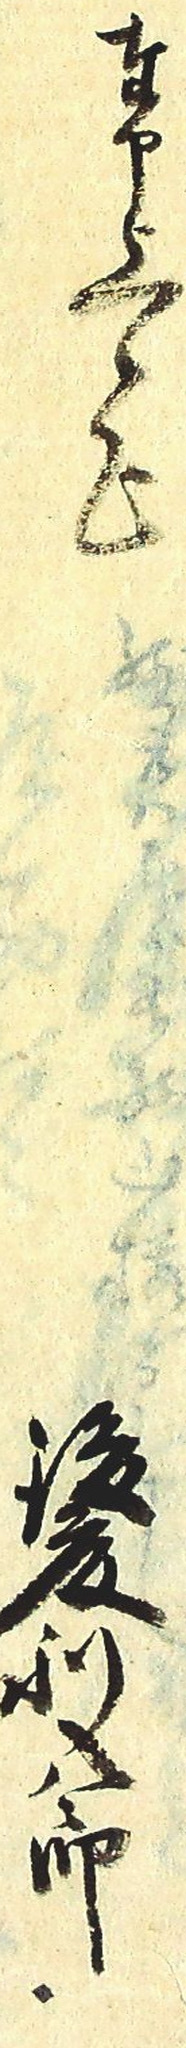奉申上候以上後藤利八郎
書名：諸御願書控(弐番）
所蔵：鳴門教育大学 Naruto University of Education
